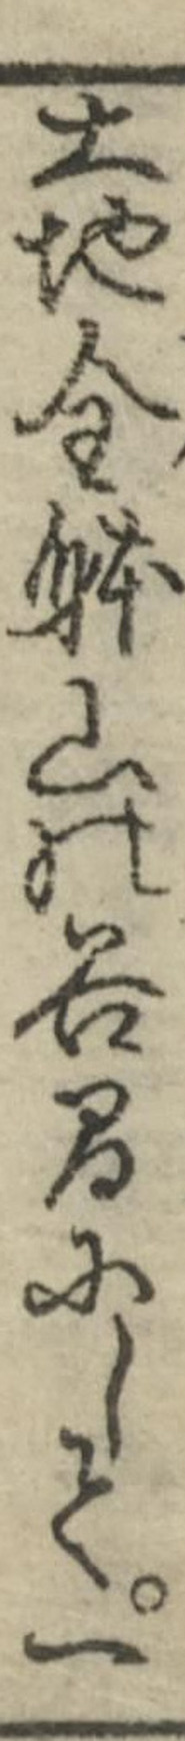土地全躰山の谷間にして。一
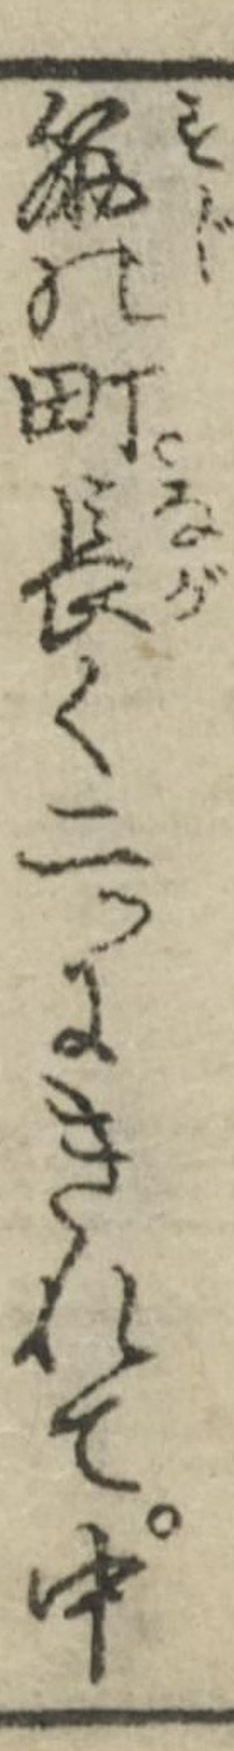筋の町。長く二ツにきれて。中
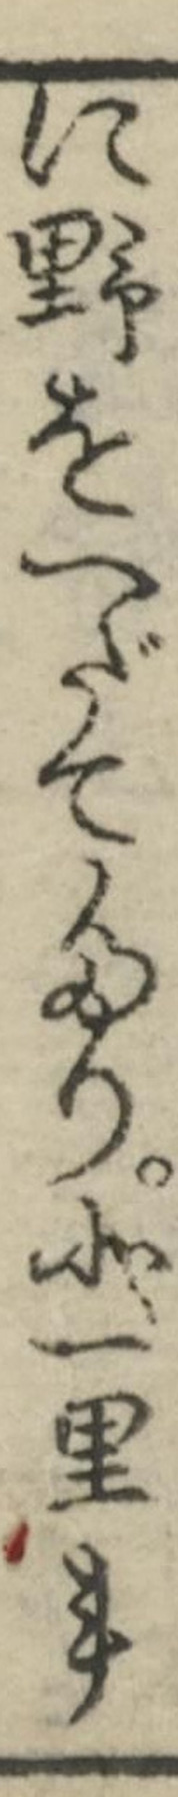に野をへだてたり。北一里半
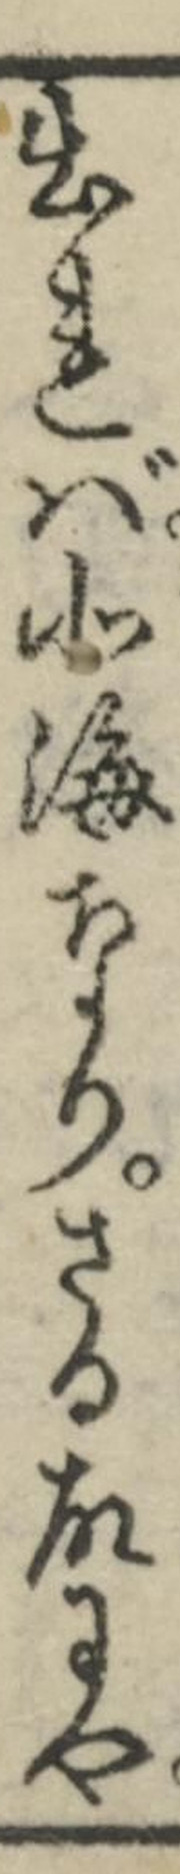出れば北海なり。さる故にや。
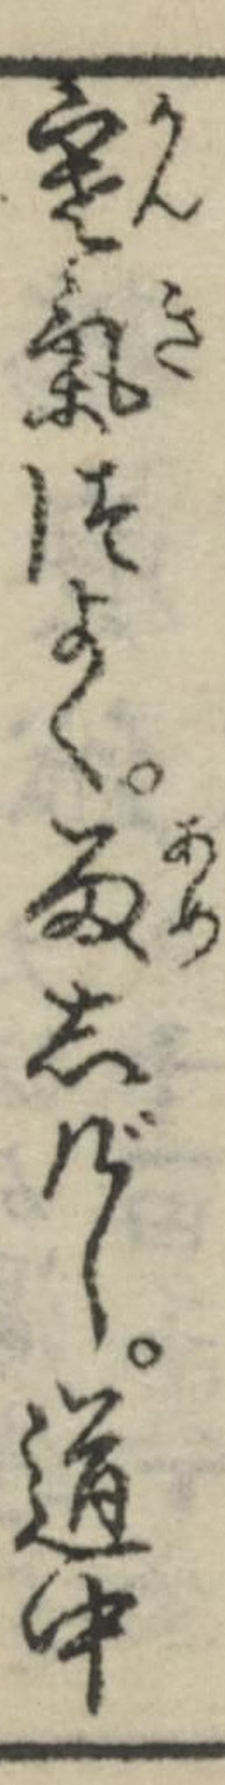雲気つよく。雨しげく。道中
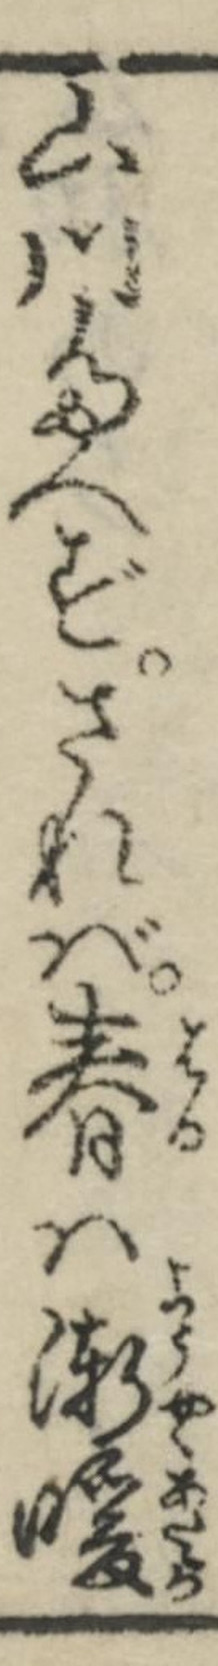山川たへず。されば。春は漸暖
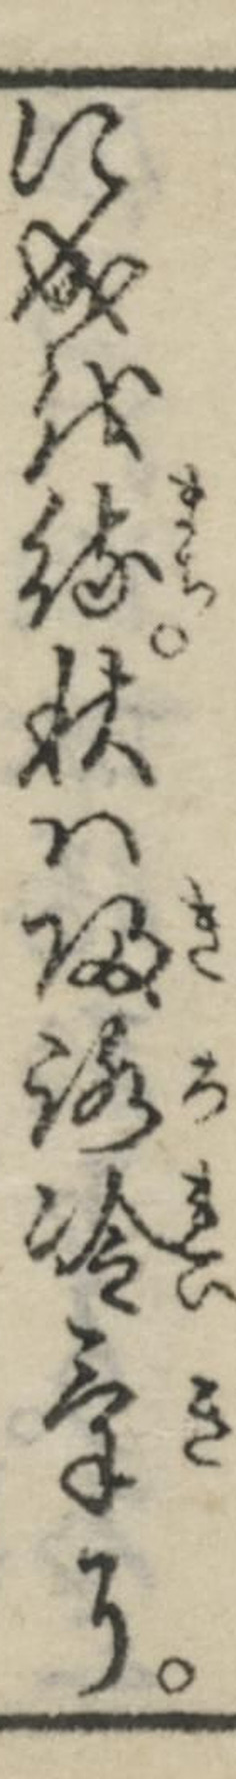に成を待。秋は帰路冷気に。
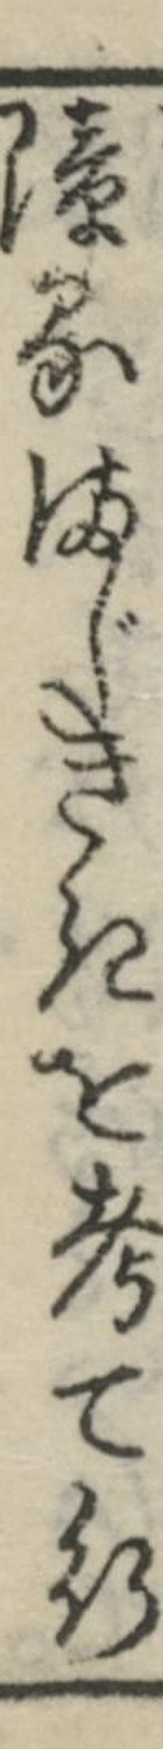障るまじき紀を考て。行
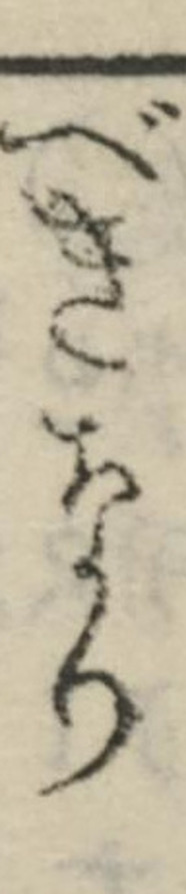べきなり
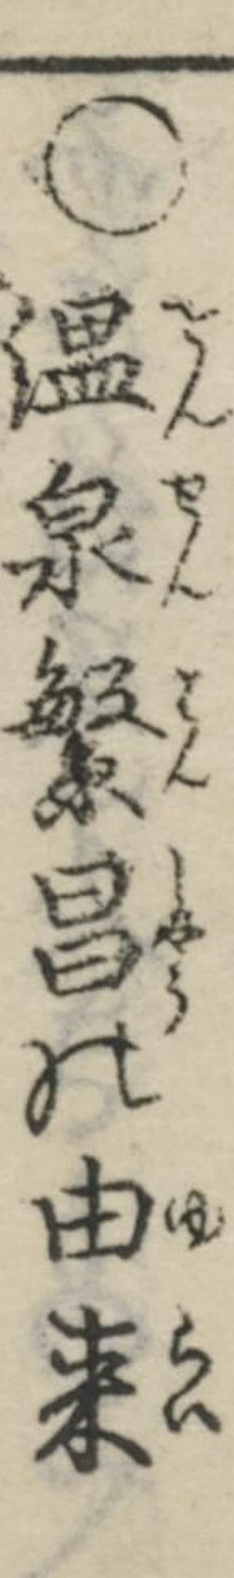○温泉繁昌の由来
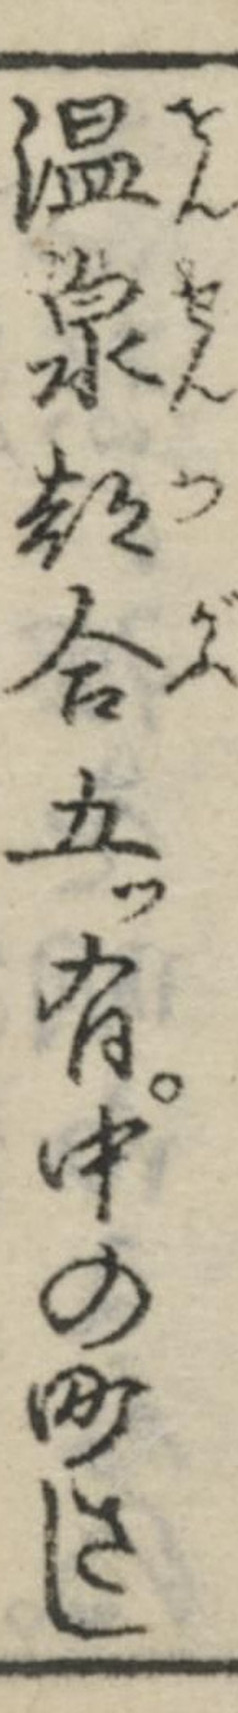温泉都合五ツ有。中の町さし
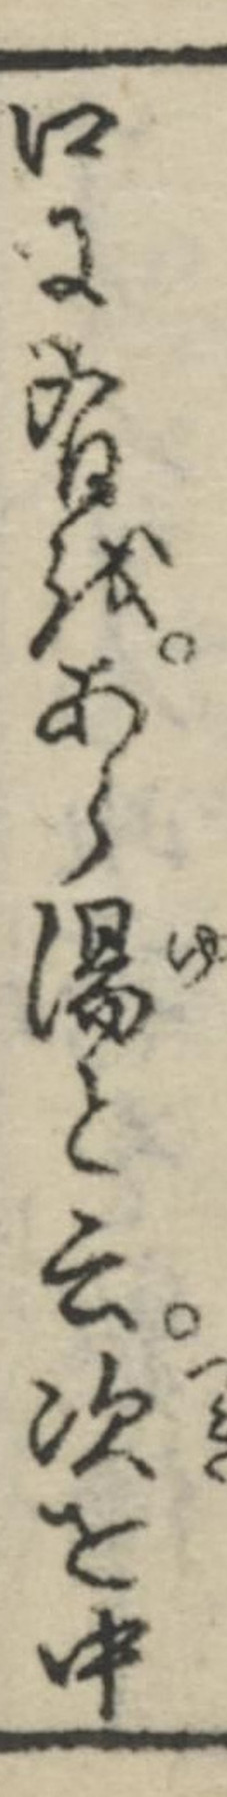口に有を。あら湯と言。次を中
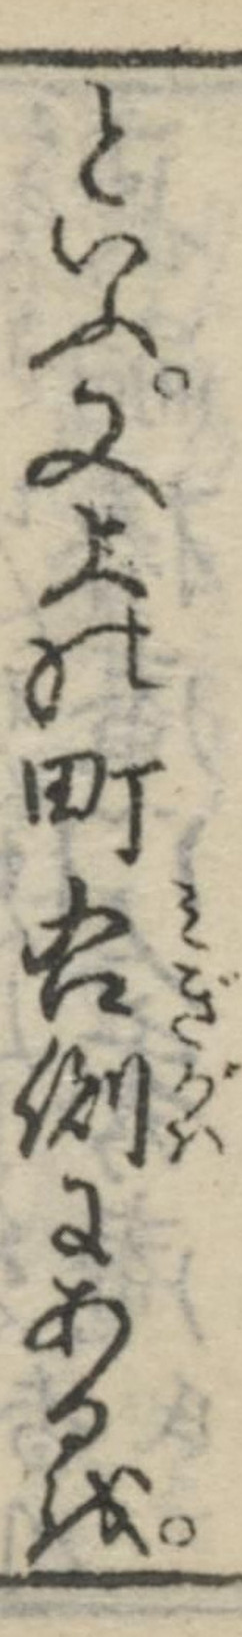といふ。又上の町右側にあるを。
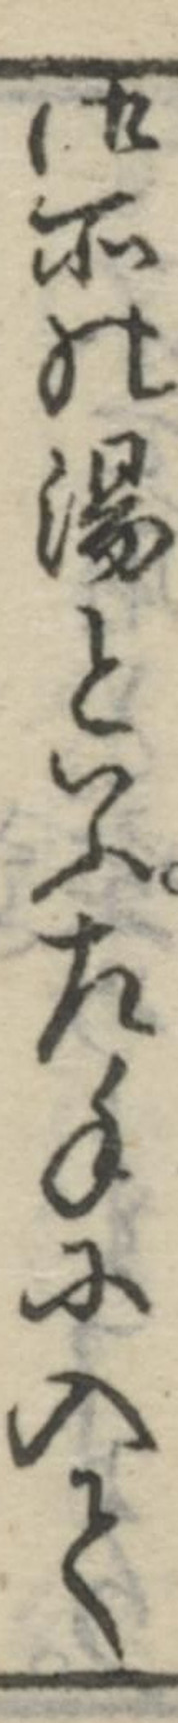御所の湯といふ。左手に入て
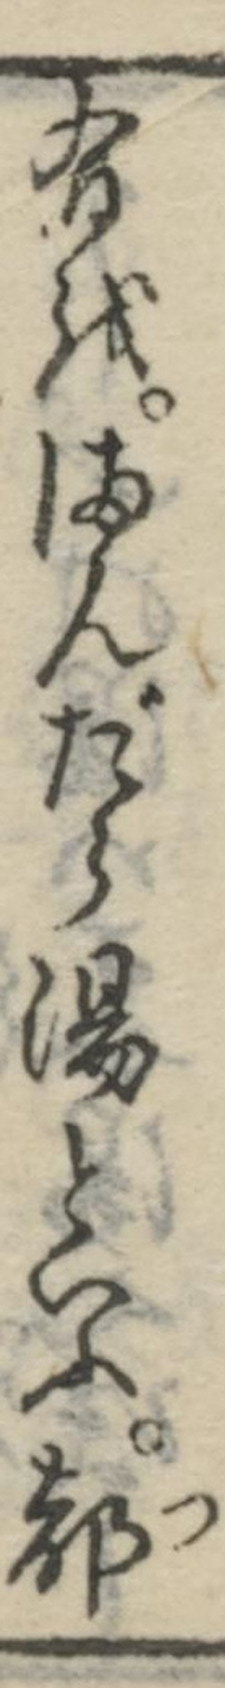有を。まんだら湯といふ。都
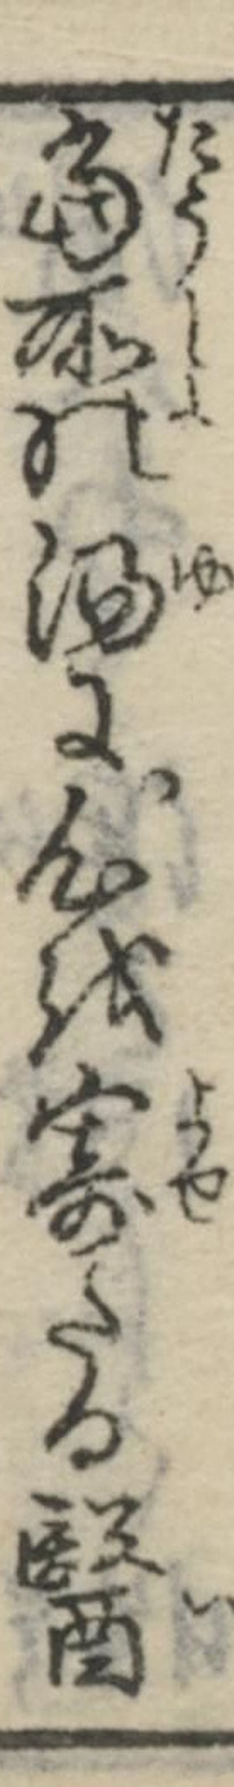当所の湯に。心を寄たる医
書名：但州城崎浴湯辧
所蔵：東京大学地震研究所図書室 Earthquake Research Institute Library, The University of Tokyo, JAPAN
